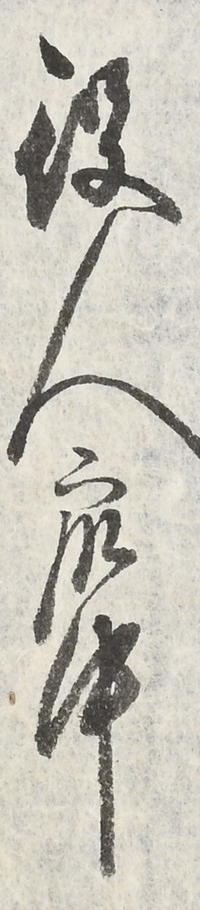役人衆中
